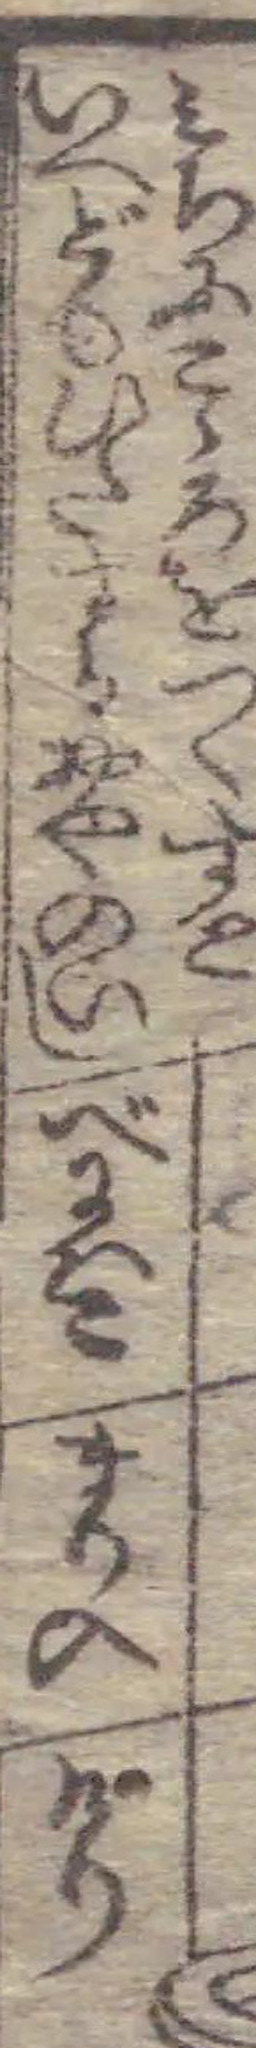いへどもひたすらおやのいしべにはこまり入けり

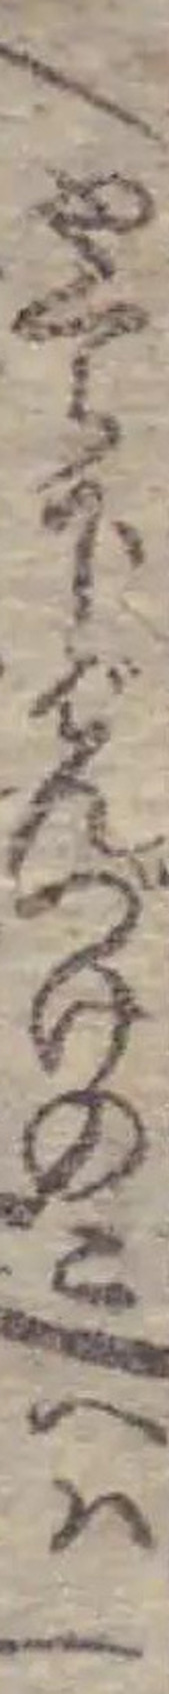やくら下ばんづけのこへは
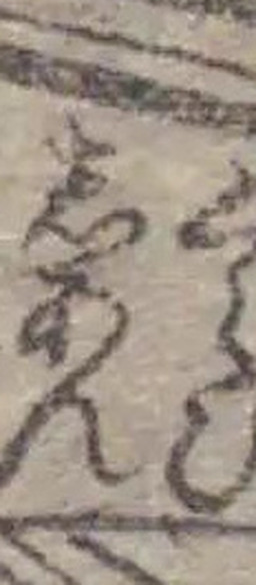しあげ
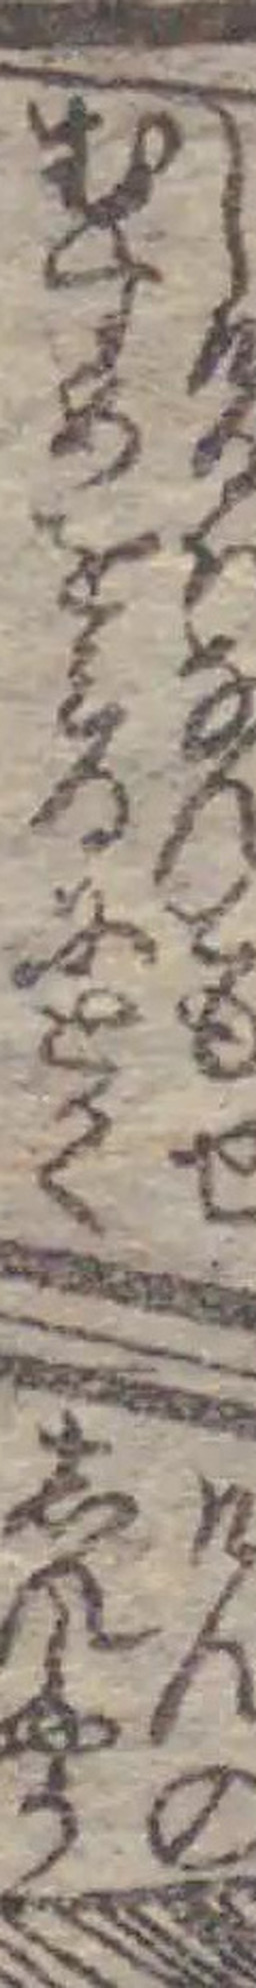むすめをみるにとかくしんしやう
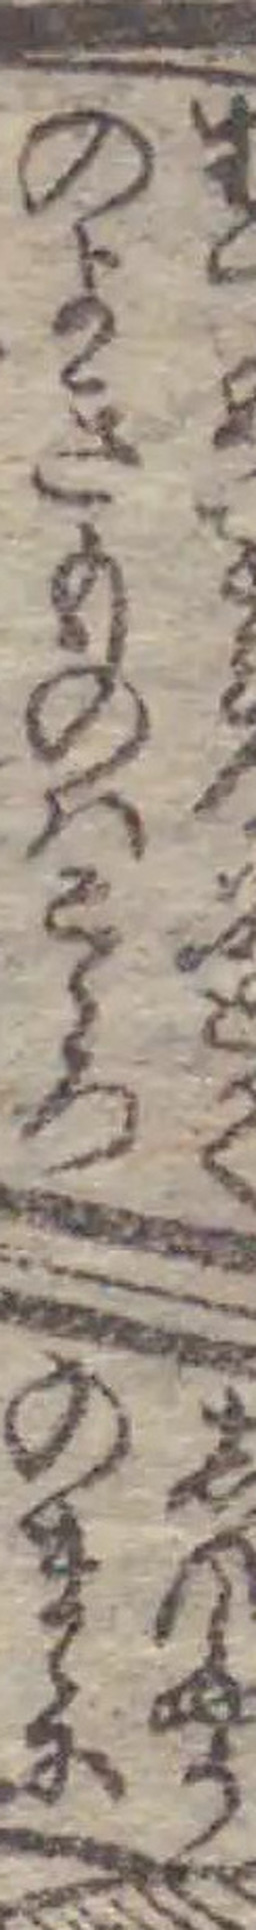のよきものはこゝろのまゝに
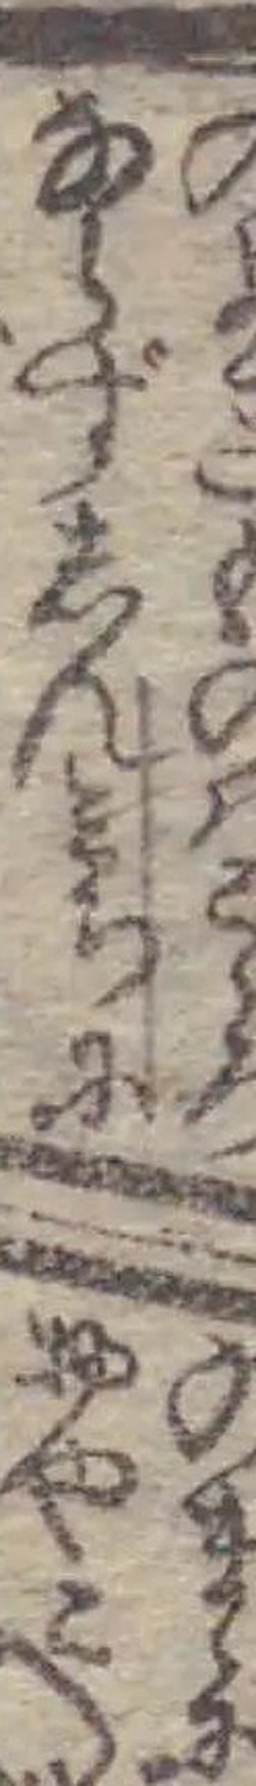ならずしんみちにおやこ
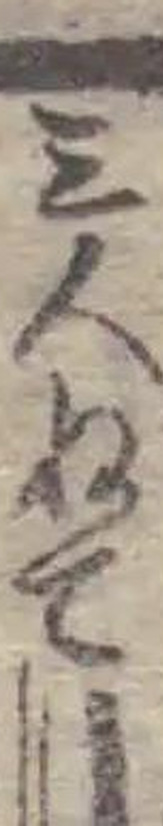三人ねて
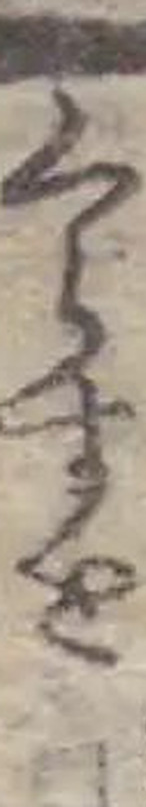くらすと
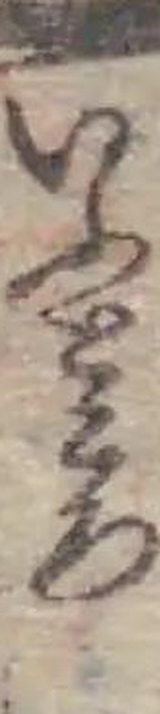いふところ
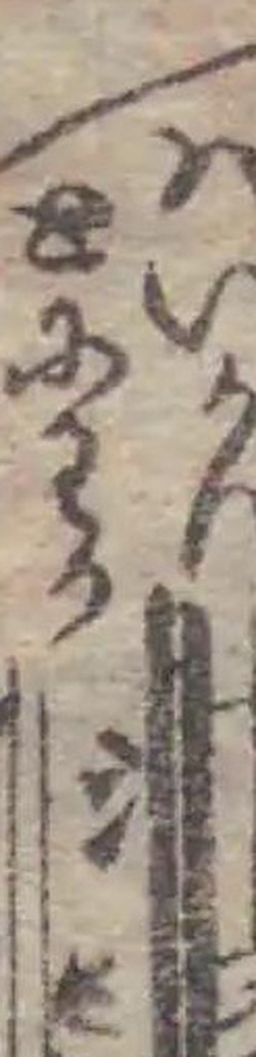とにわか
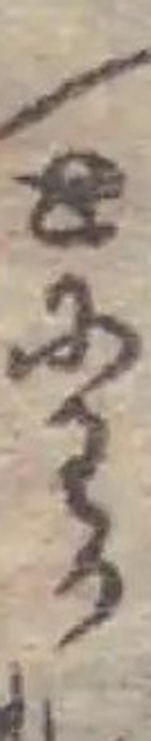とにわか
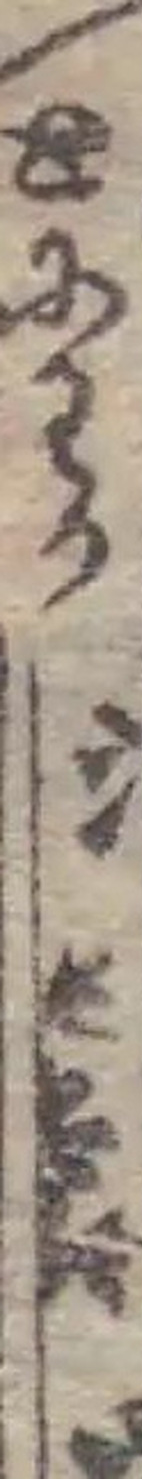とにわか
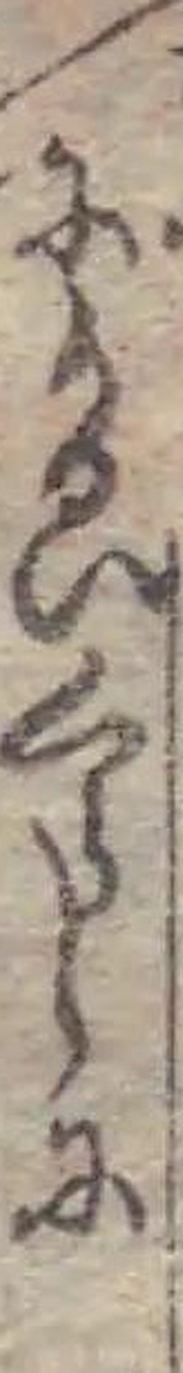にかるいくらしに
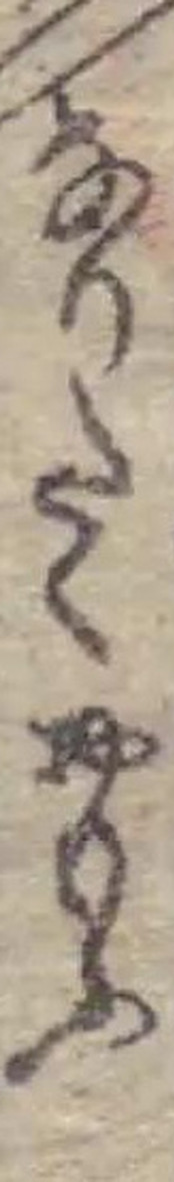なりたくおもふ
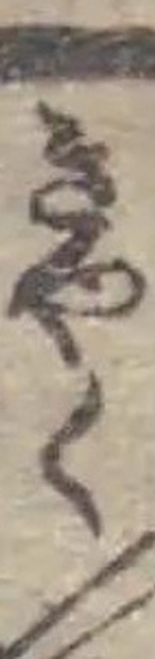きやく
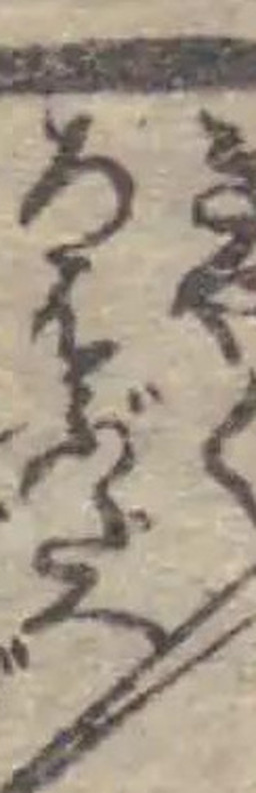ろはぶたへ
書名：かんなんの夢枕 2巻
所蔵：国立国会図書館 National Diet Library, JAPAN
